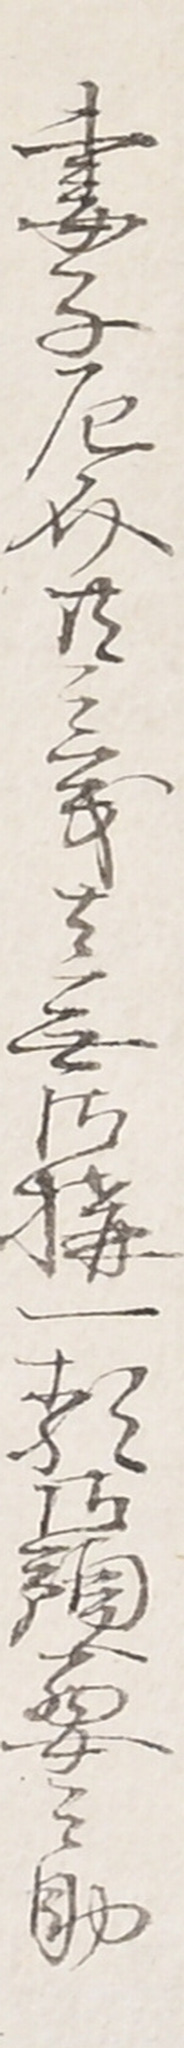妻子厄介共之義者無御構一類御預要之助
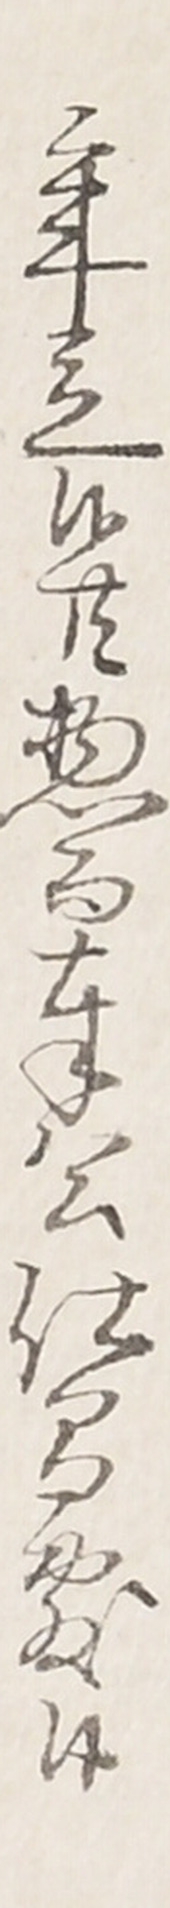年立候共惣而奉公仕間敷候
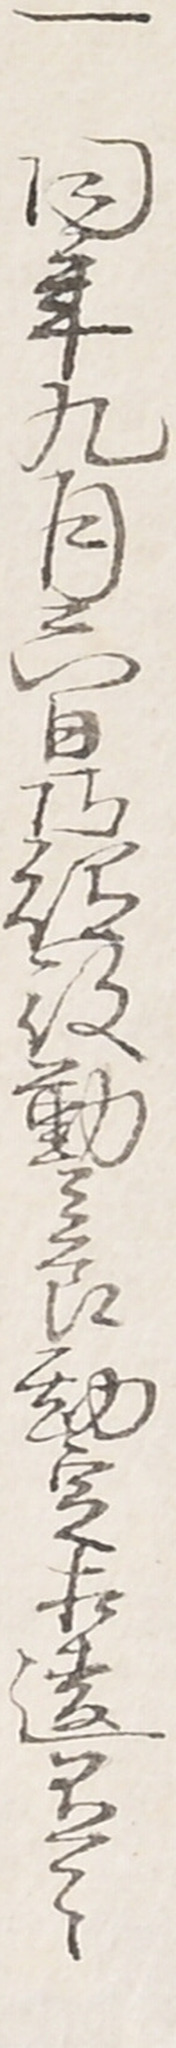一同年九月六日御賄役勤之節勘定相違有之
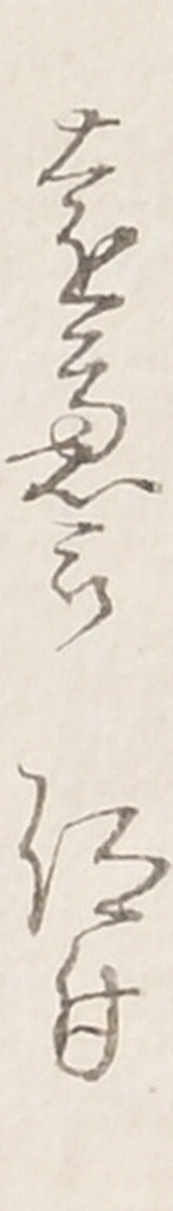遠慮被仰付
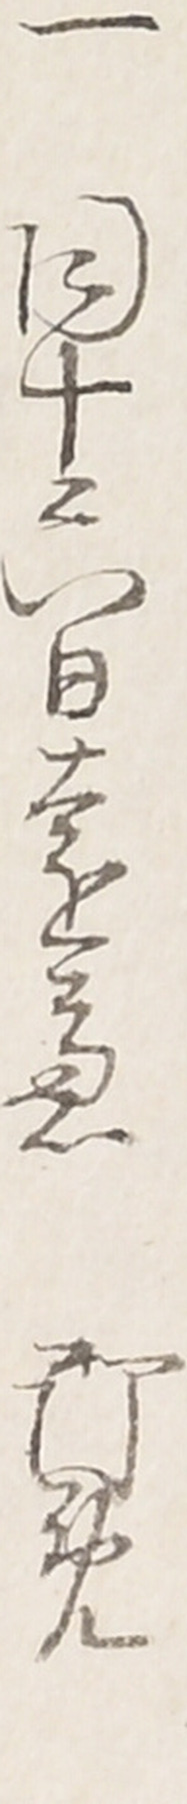一同十六日遠慮御免
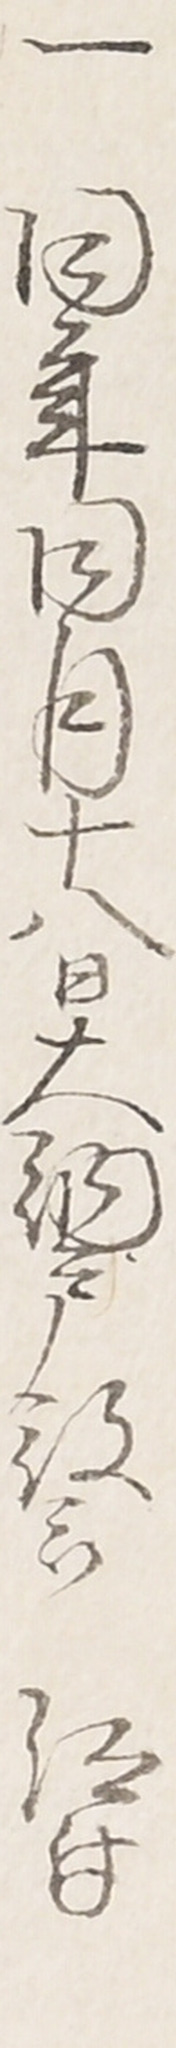一同年同月十八日大納戸役被仰付
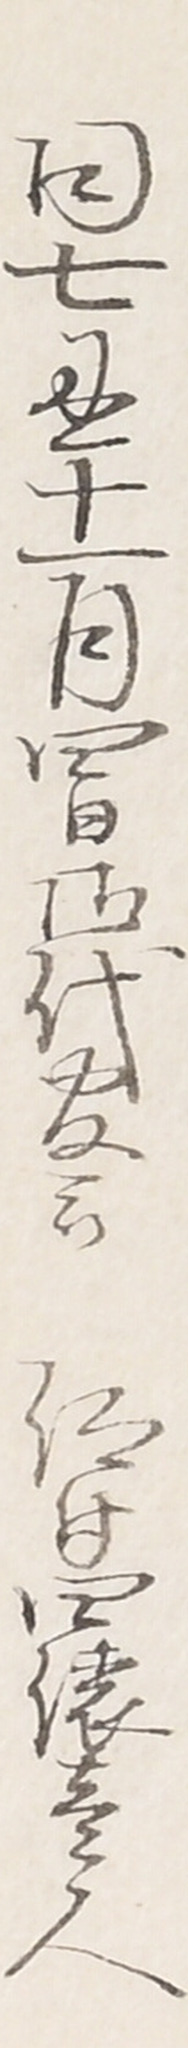一同七丑十一月四日御代官被仰付四俵壱人
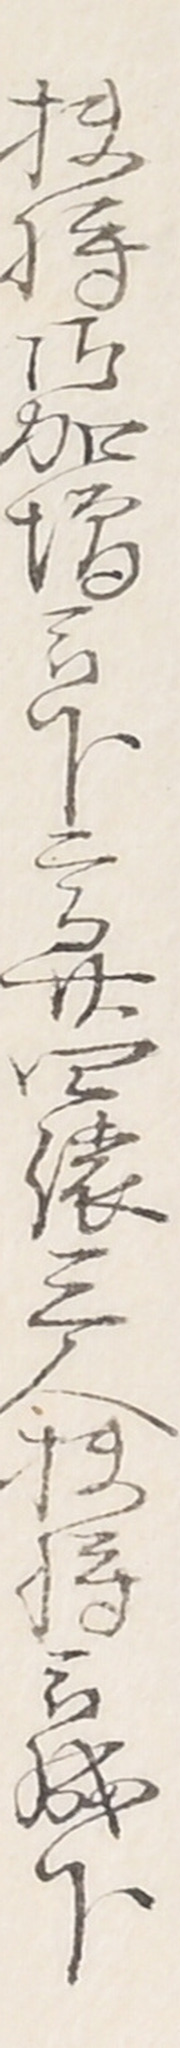扶持御加増被下高廿四俵三人扶持被成下
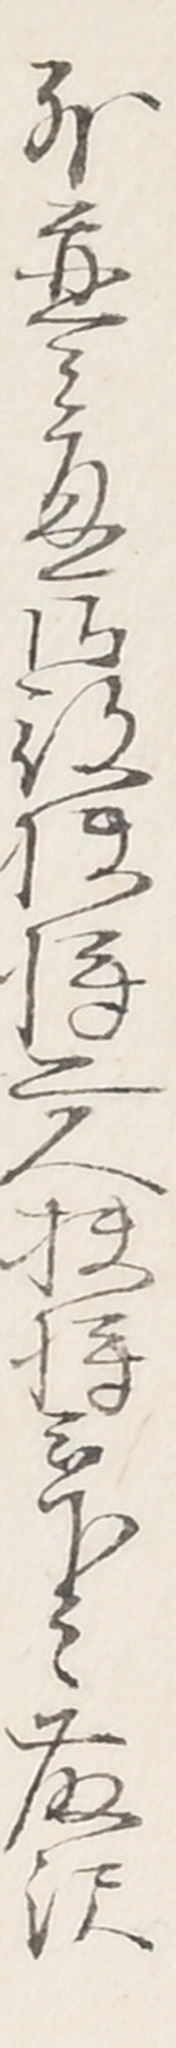外並之通御役扶持二人扶持被下之藤沢
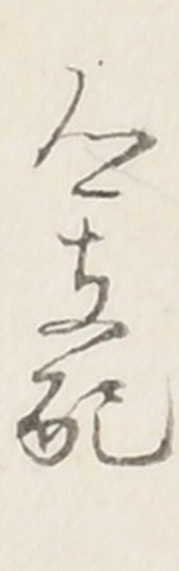郷支配
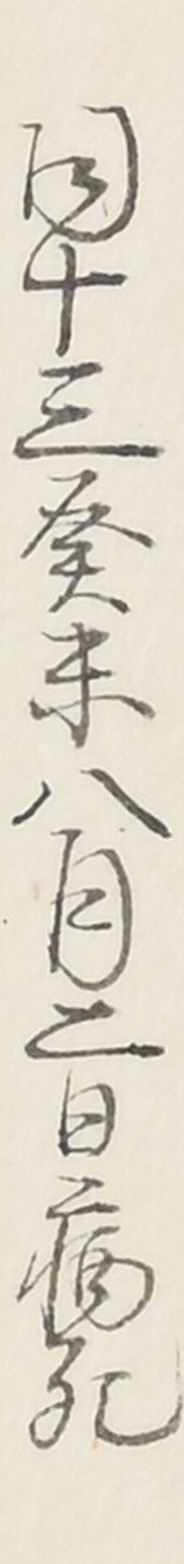一同十三癸未八月二日病死
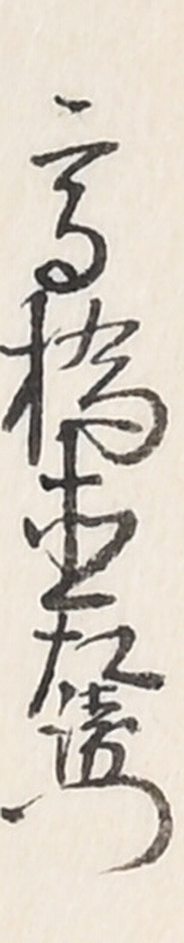高橋直左衛門
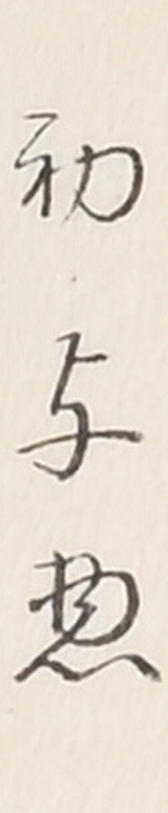初与惣
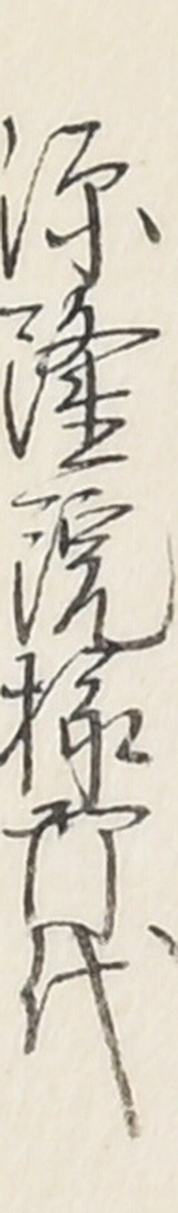源隆院様御代
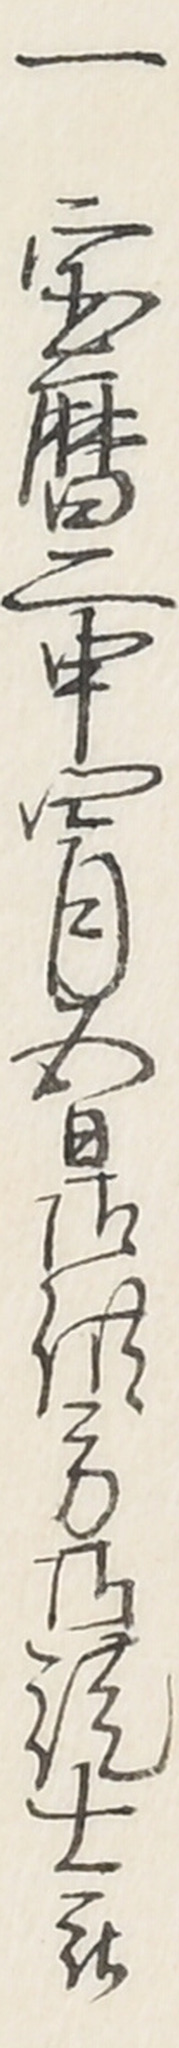一宝暦ニ申四月五日御供方御徒士被
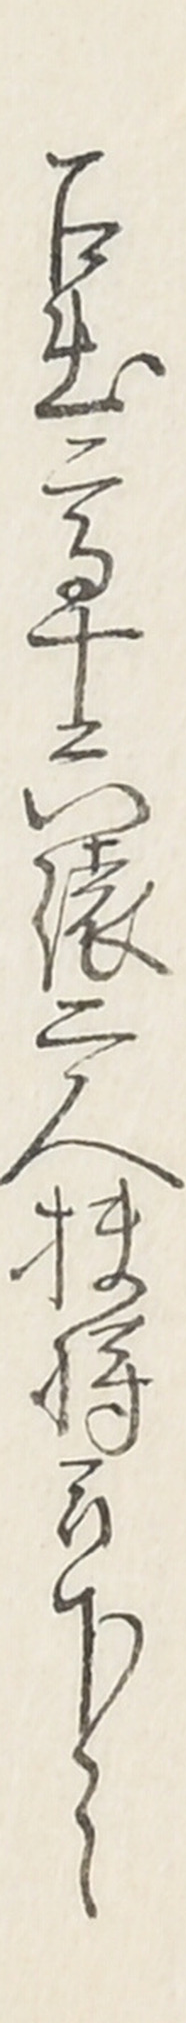召出高十六俵二人扶持被下之
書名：無足諸士勤仕録（四）
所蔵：伊那市立高遠町図書館・合同会社AMANE
